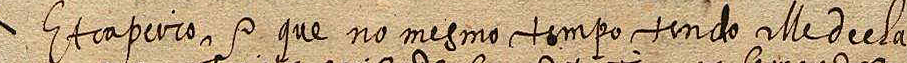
E trapeiro, e que no mesmo tempo tendo elle decla
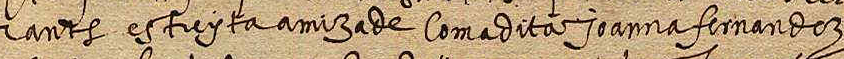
rantꝭ estreyta amizade com a dita Joanna fernandez
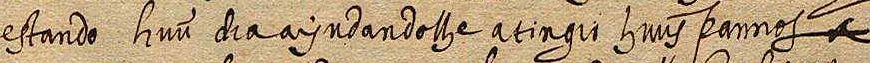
estando huu̅ dia ayudandolhe a tingir huu̅s pannos a
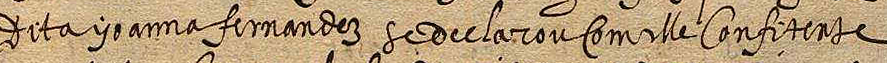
Dita yoanna fernandez se declarou com elle Confitente
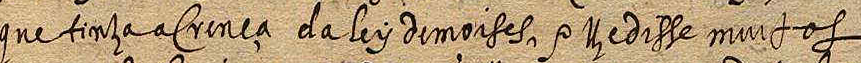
que tinha a Crença da ley de moises, e lhe disse muitos
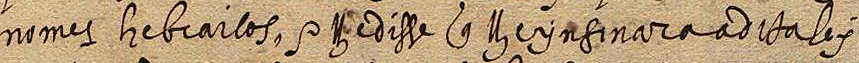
nomes hebraicos, e lhe disse q̅ lhe ynsinara a dita ley
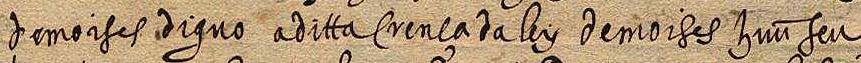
de moises diguo a ditta Crença da ley de moises huu̅ seu
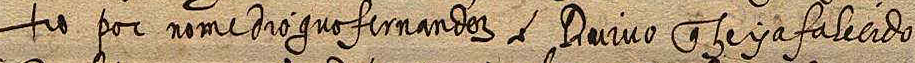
tio por nome dioguo fernandez o Ruiuo q̅ he ya falecido
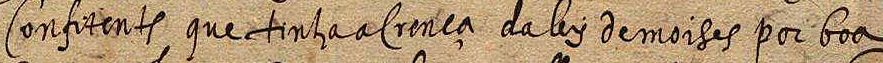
Confitente que tinha a Crença da ley de moises por boa
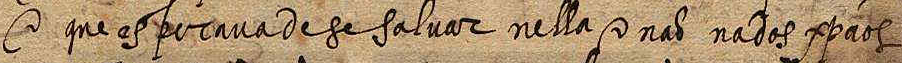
e que esperaua de se saluar nella e não na dos xpaõs
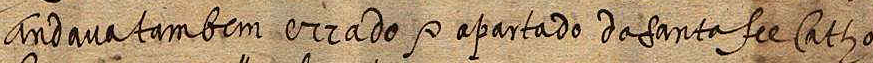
andaua tambem errado e apartado da santa fee Catho
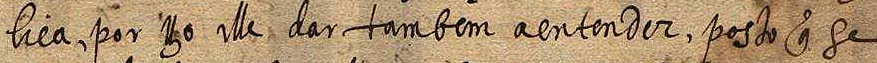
lica, por lho elle dar tambem a entender, posto q̅ se
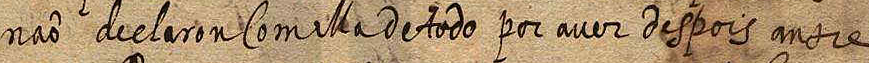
não declarou Com ella de todo por auer despois antre
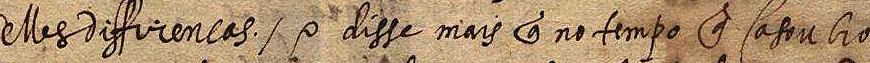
elles diffirenças./ e disse mais q̅ no tempo q̅ Casou ho
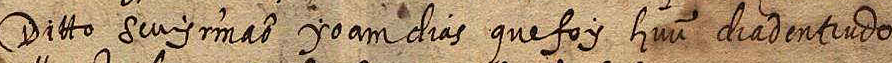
Ditto seu yrmaõ yoam dias que foy huu̅ dia dentrudo
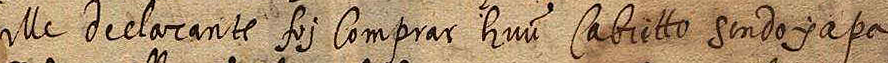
elle declarante foj Comprar huu̅ Cabritto sendo ya pa
